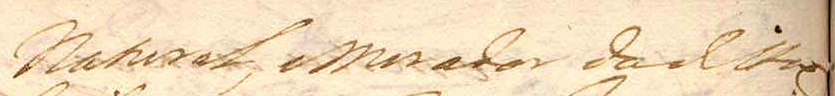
Natural, e morador da ditta
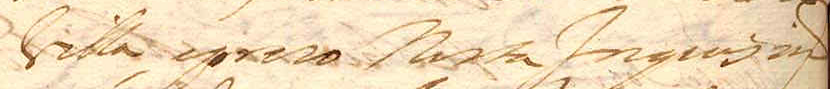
Villa, e prezo nesta Jnquizição
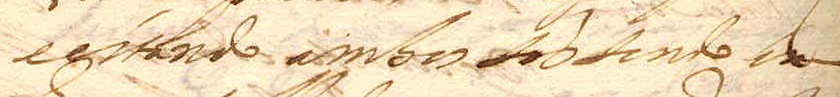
e estando ambos sos̄ sendo em
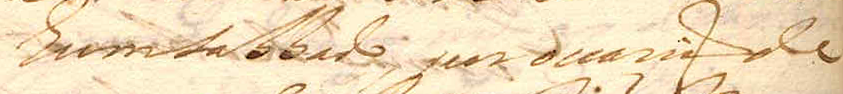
hum sabbado, por occaziaõ de
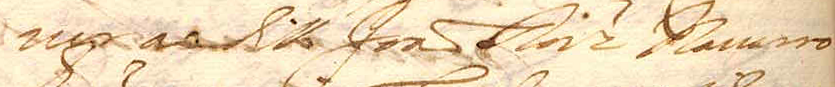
uer ao dito Joaõ Roiz̄ Nauarro
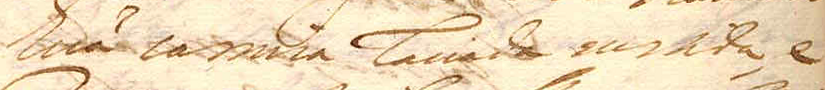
huā camiza lauada uestida, e
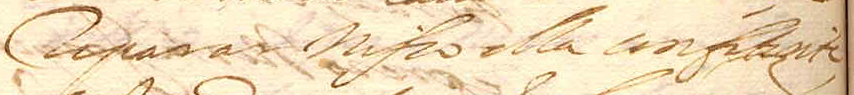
Reparar nisso ella confitente,
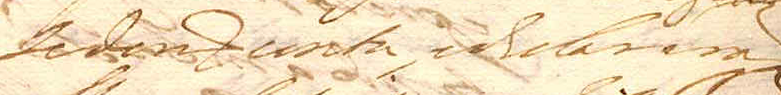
se deraõ conta e declaraõ
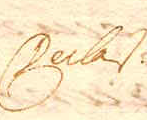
Declar.
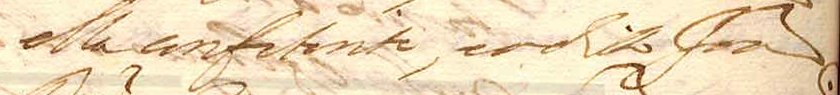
ella confitente, e o dito Joaõ
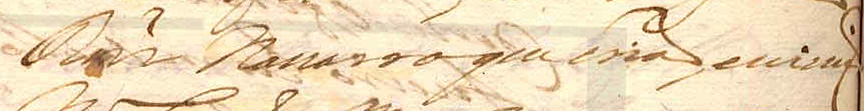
Roiz̄ Nauarro que criaõ, e uiuiaõ
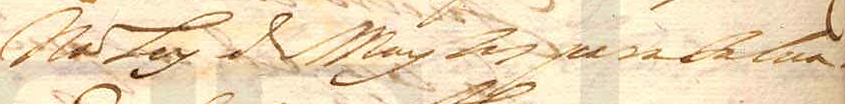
Na Ley de Moyses para salua
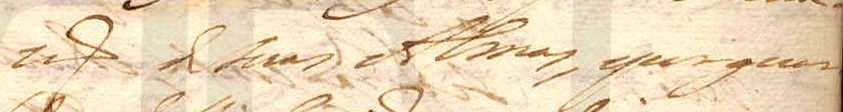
çaõ de suas Almas, e por guar
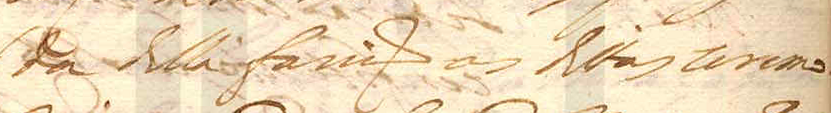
da della faziaõ as dittas ceremo
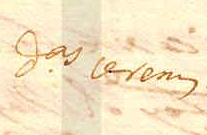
d.as cerem
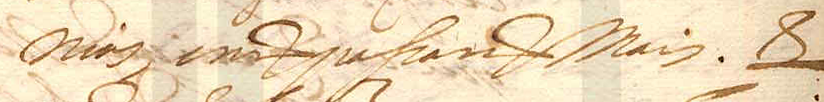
nias, e naõ passaraõ mais. E
